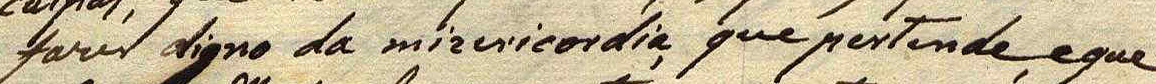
fazer digno da mizericordia, que pertende, e que
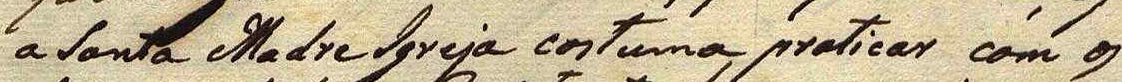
a Santa Madre Igreja costuma, praticar com os
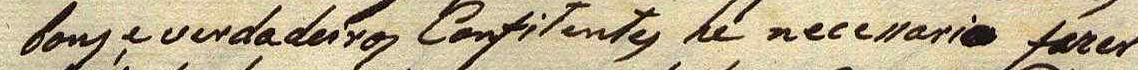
bons, e verdadeiros Confitentes hé necessario fazer
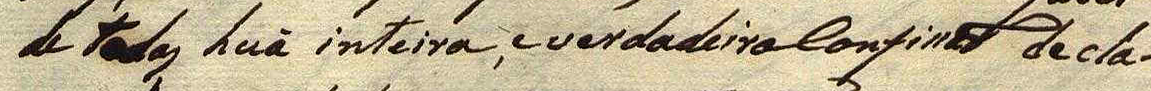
de todas huā inteira, e verdadeira Confissaõ decla
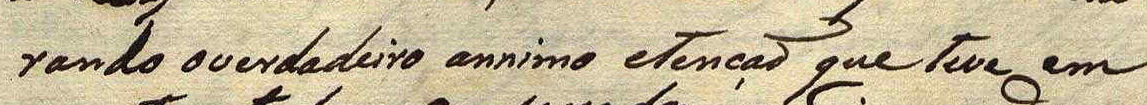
rando o verdadeiro annimo e tençaõ que teve em
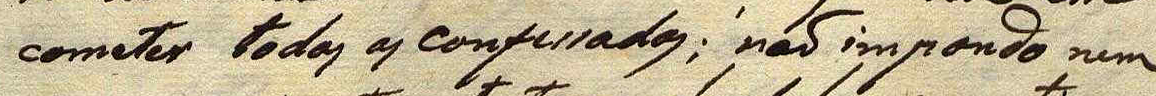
cometer todas as confessadas; naõ impondo nem
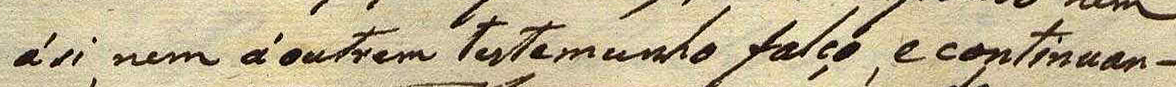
á si, nem á outrem testemunho falço, e continuan
